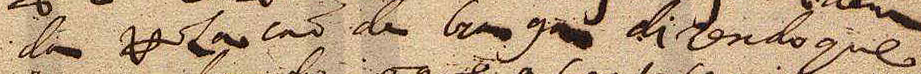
da Rolaçaõ de braga dizendo que
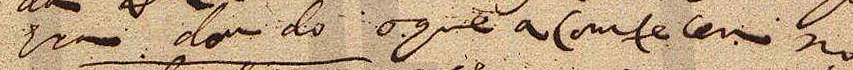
Era doudo o que aComteceu no
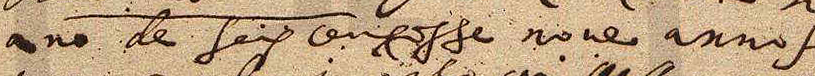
ano de seiscentos he noue annos
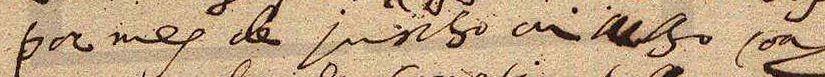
por mes de junho ou iulho coaL
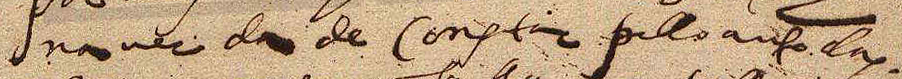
na uerdade Constar pello auto das
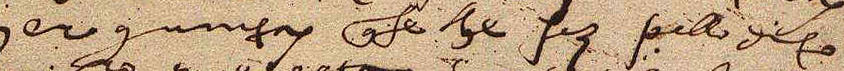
Perguntas q̄ se lhe fez pello dito
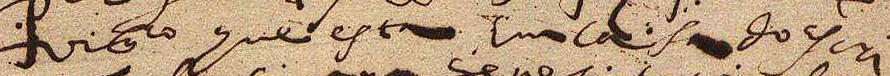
vigro que esta Em casa do Escri
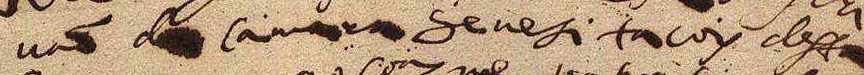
uaõ da camara he uesitaçois desta
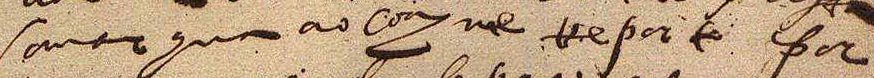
Comarqua ao coal me Reporto e por
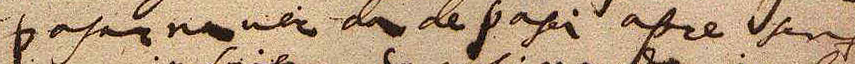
pasar na uerdade pasei a presente
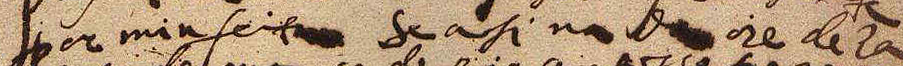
por min feita he asinada oie deza
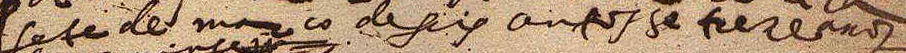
sete de março de seiscentos he treze anos
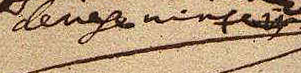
deuese uinte rs
